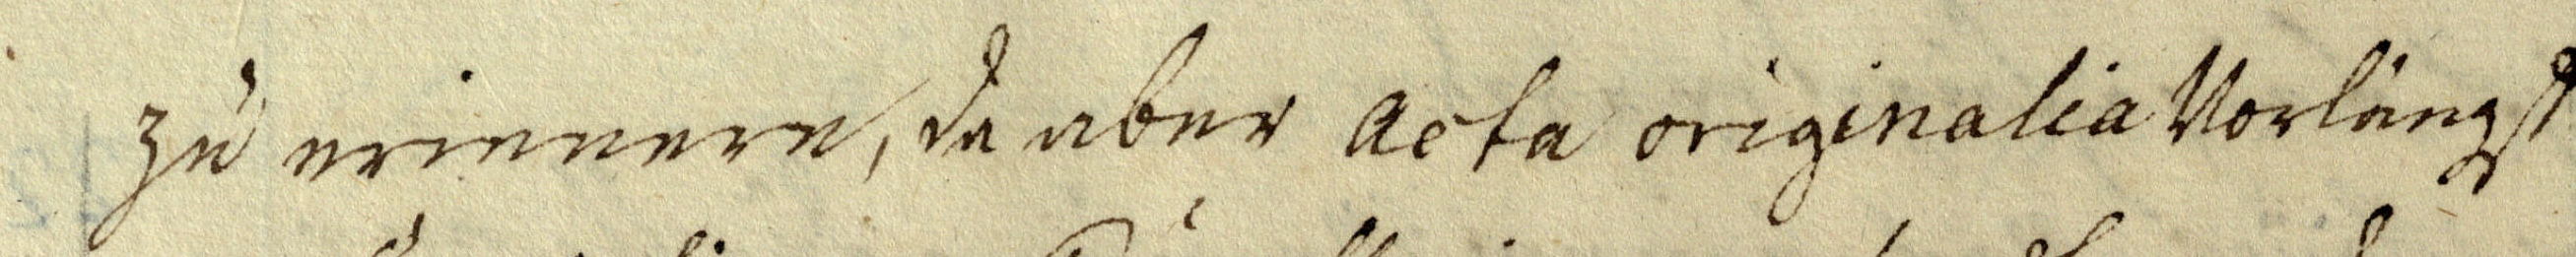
zu erinnern, da aber Acta originalia vorlängst
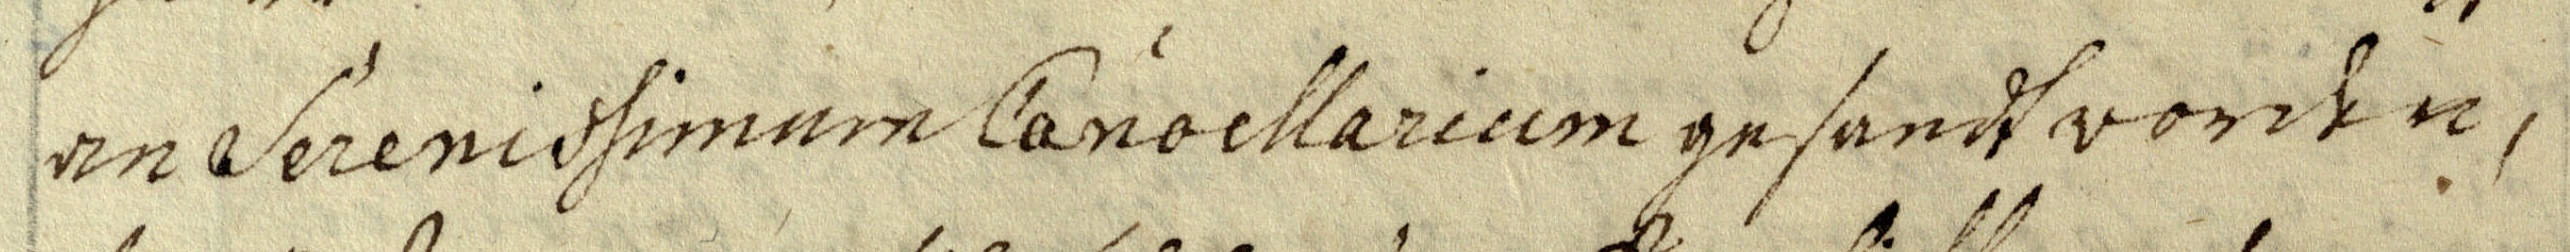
an Serenissimum Cancellarium gesandt worden,
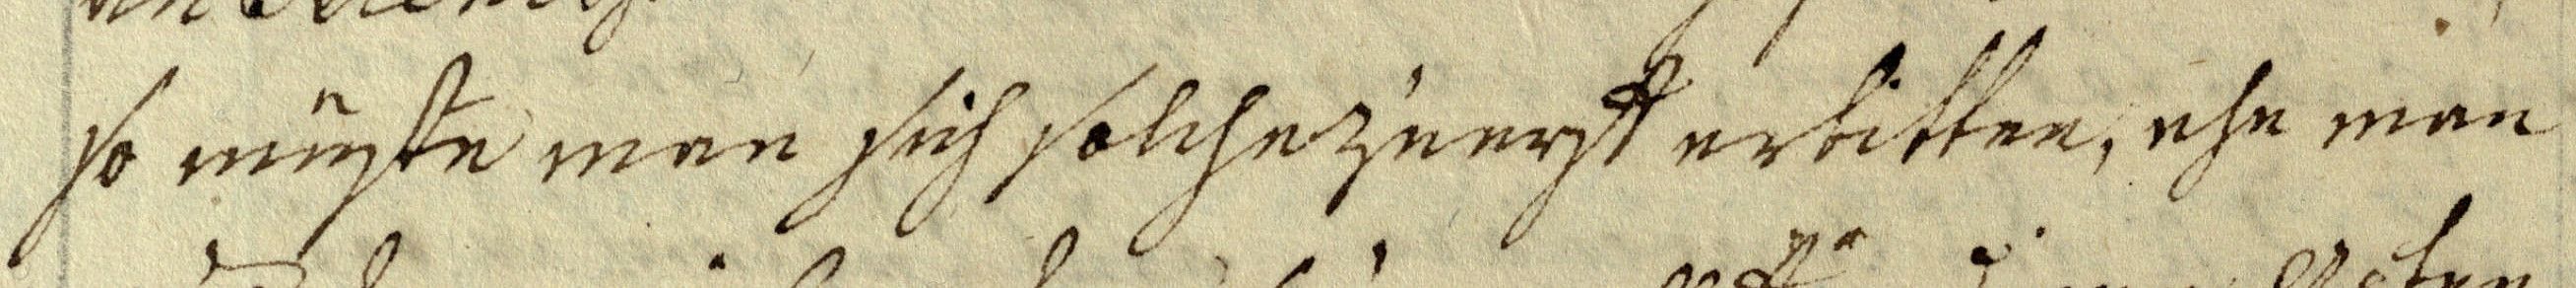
so müste man sich solche zuerst erbitten, ehe man
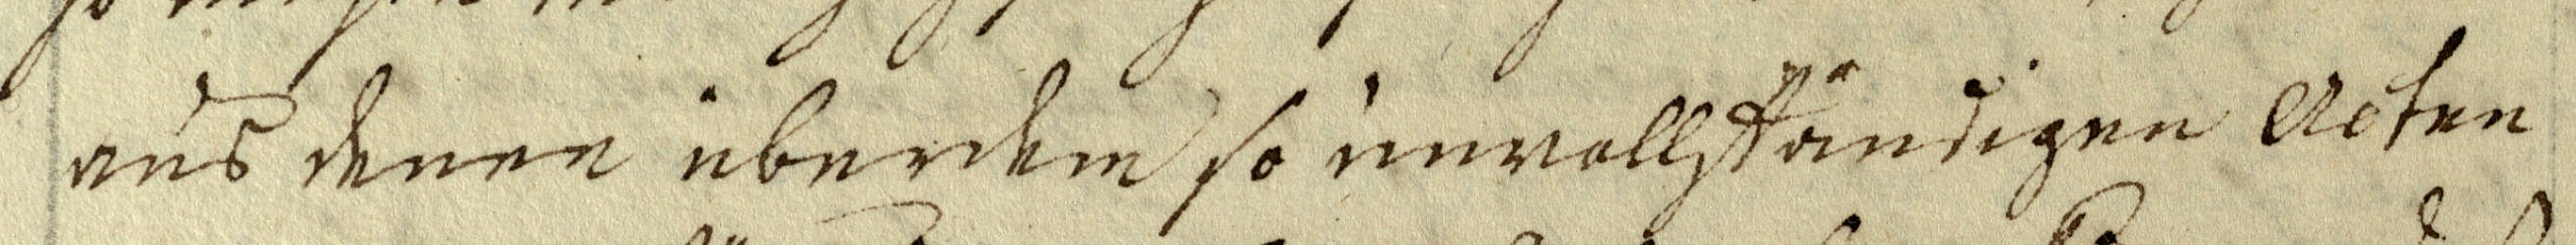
aus denen überdem so unvollständigen Acten
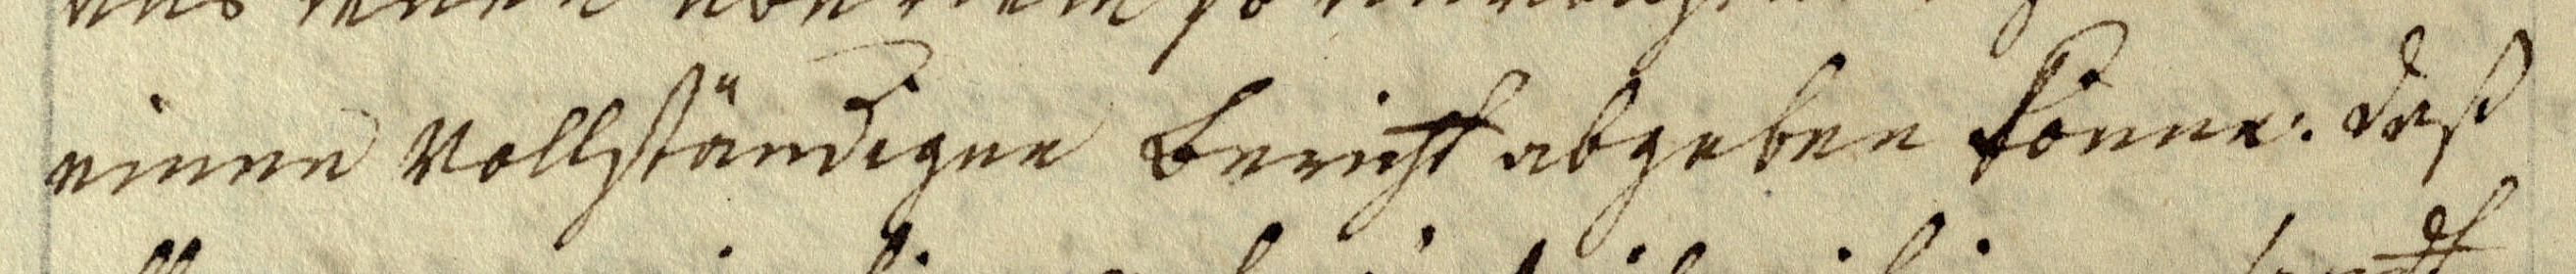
einen vollständigen Bericht abegeben könne. Daß
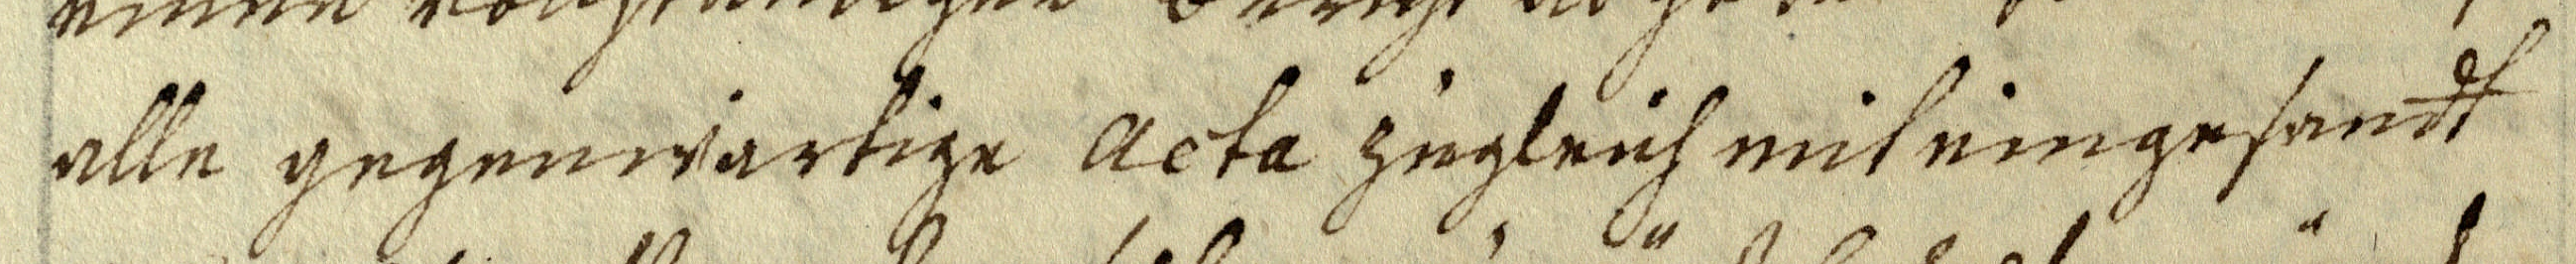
alle gegenwärtige Acta zugleich mit eingesandt
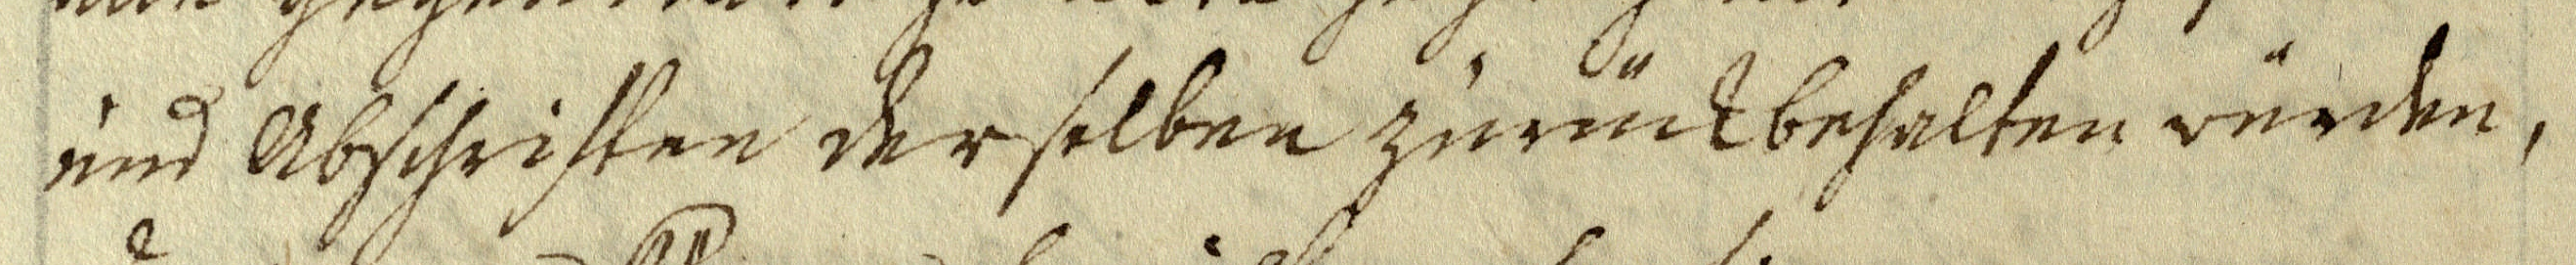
und Abschriften derselben zurück behalten würden,
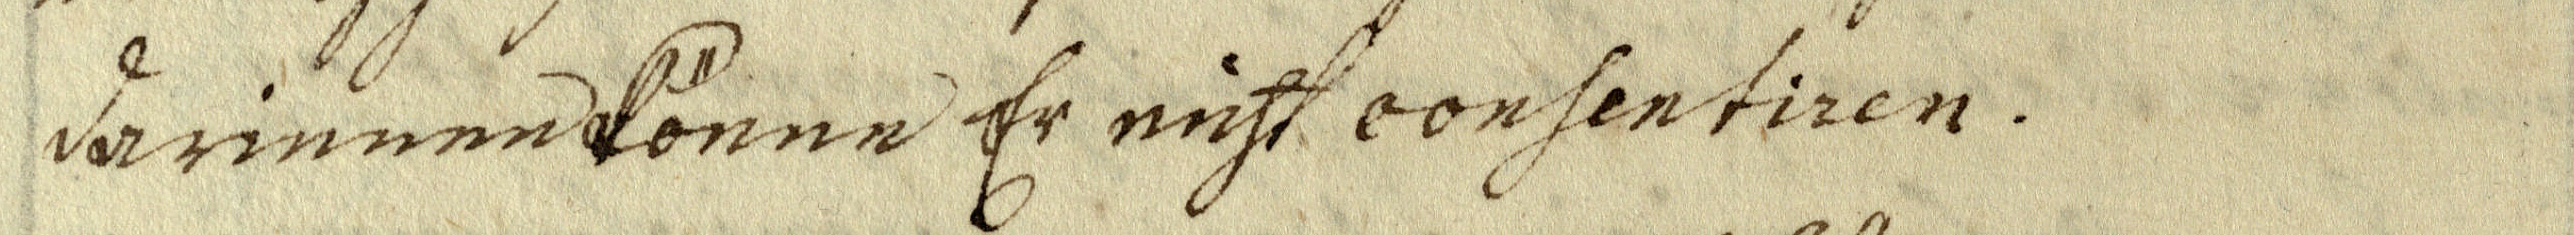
darinnen könne Er nicht consentiren.
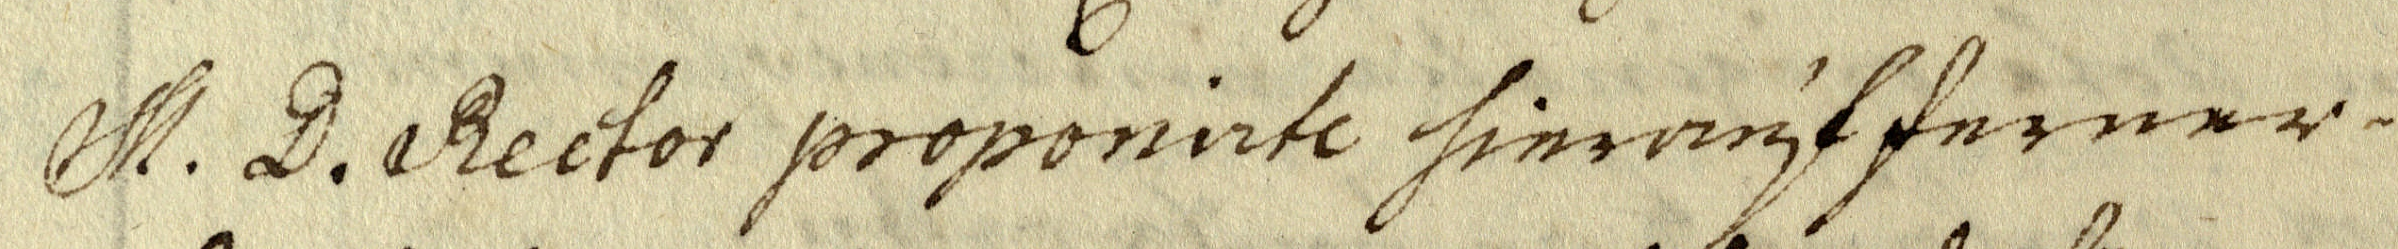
M. D. Rector proponirte hierauf ferner
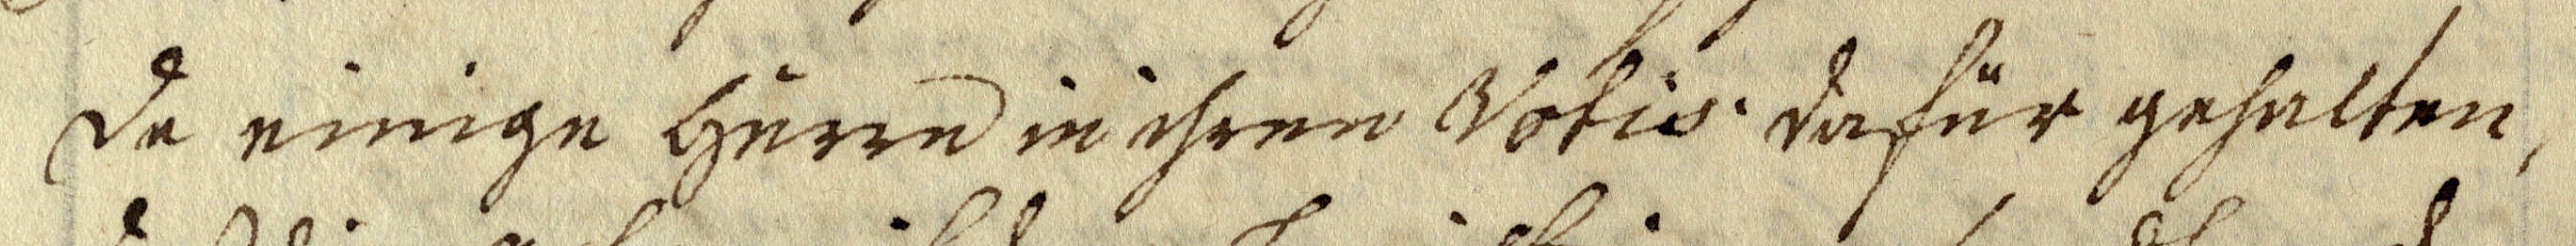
da einige Herrn in ihren Votis dafür gehalten,
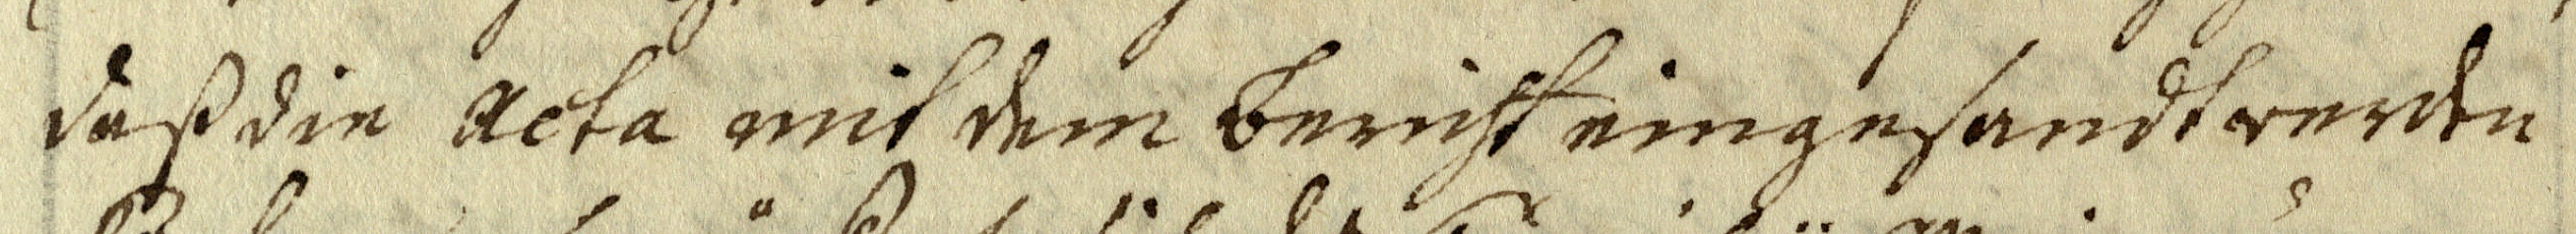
daß die Acta mit dem Bericht eingesandt werden
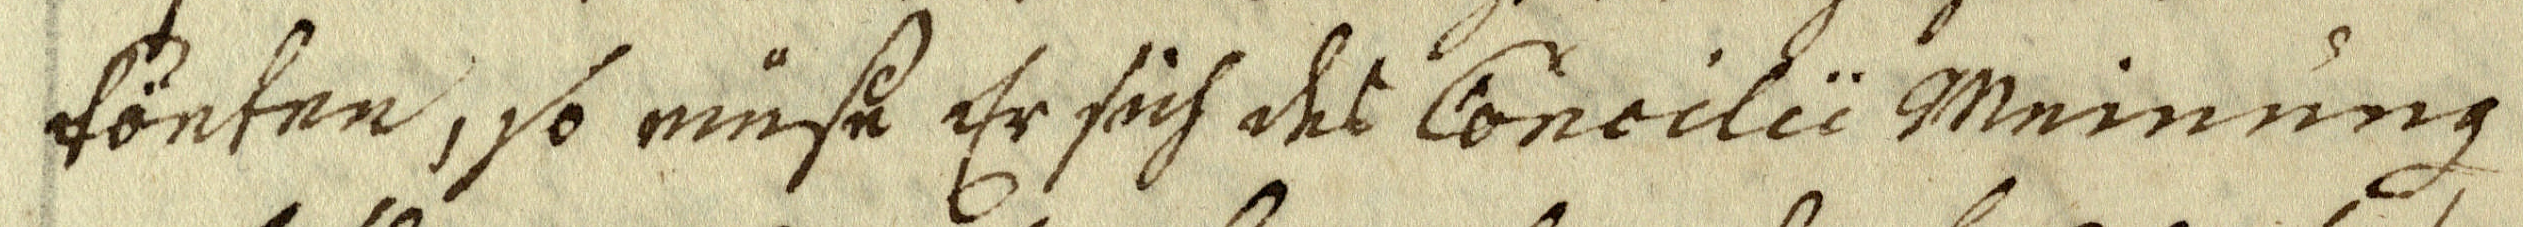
könten, so müße Er sich des Concilii Meinung
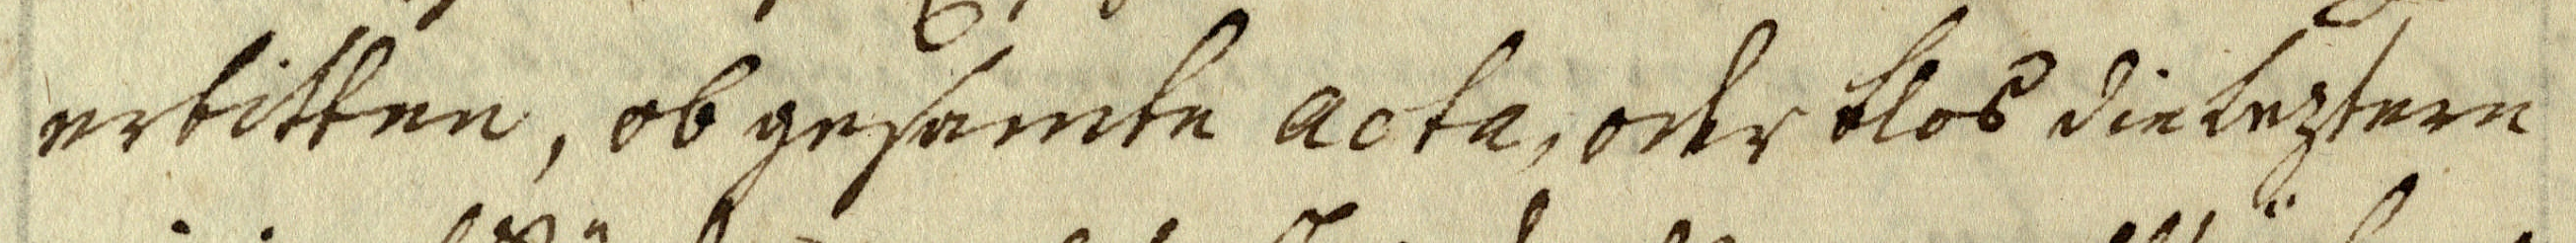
erbitten, ob gesamte Acta, oder blos die lezten
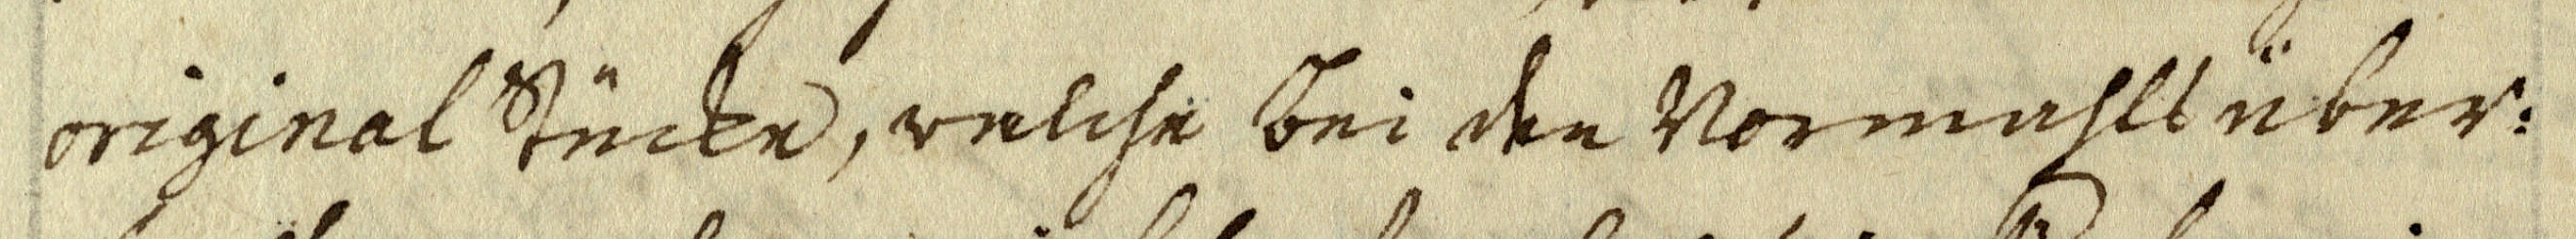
original Stücke, welche bei den vormahls über¬
